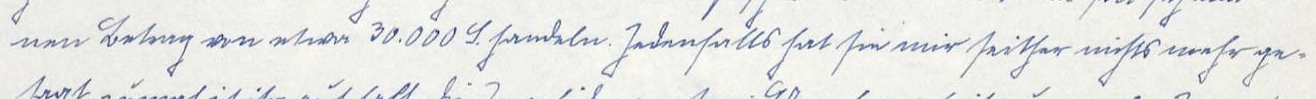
nen Beitrag von etwa 30. 000 S Handeln. Jedenfalls hat sie mir seither nichts mehr ge-
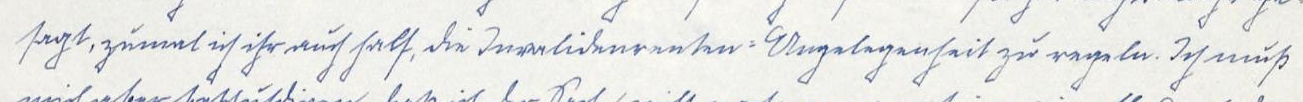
sagt, zumal ich ihr auch half, die Invalidenrenten- Angelegenheit zu regeln. Ich muss
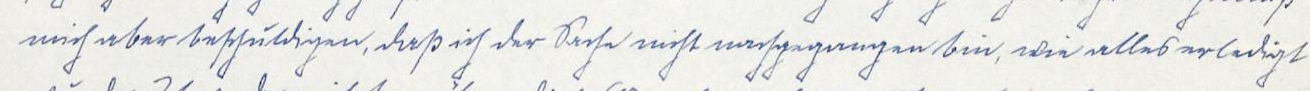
mich aber beschuldigen, dass ich der Sache nicht nachgegungen bin, wie alles erledigt
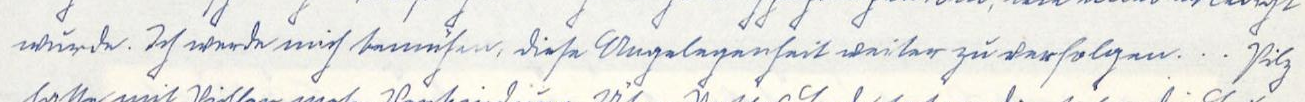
wurde. Ich werde mich bemühen, diese Angelegenheit weiter zu verfolgen. Pilz
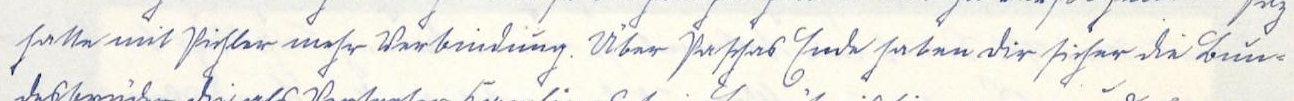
hatte mit Pichler mehr Verbindung. Über Paschas Ende haben dir sicher die Bun-
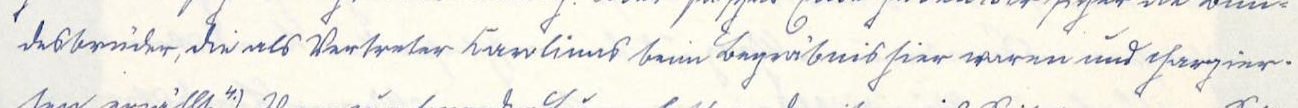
desbrüder, die als Vertreter Carolinas beim Begräbnis hier waren und chargier-
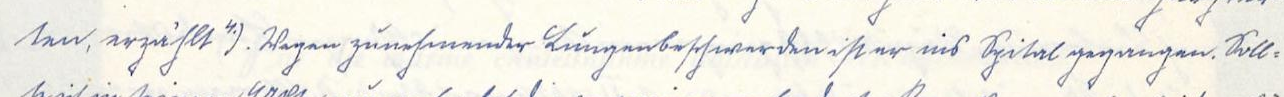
ten, erzählt 4).Wegen zunehmender Lungenbeschwerden ist er ins Spital gegangen. Soll-
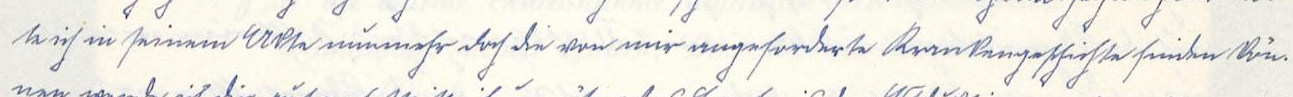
te ich in seiner Akte nunmehr doch die von mir angeforderte Krankengeschichte finden kön-
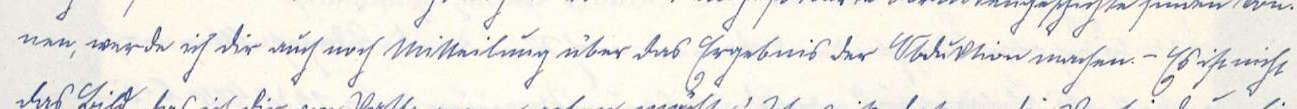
nen, werde ich dir auch noch Mitteilung über das Ergebnis der Obduktion machen Es ist nicht
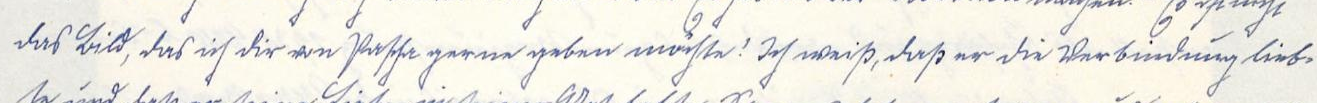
das Bild, das ich dir von Pascha gerne geben möchte! Ich weiß, daß er die Verbindung lieb-
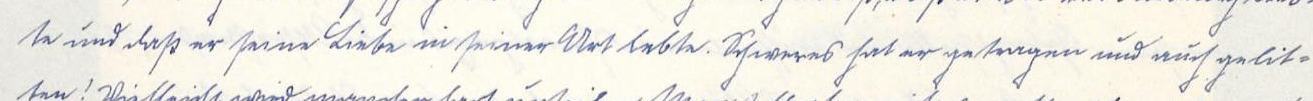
te und dass er seine Liebe in seiner Art lebte. Schweres hat er getragen und auch gelit-
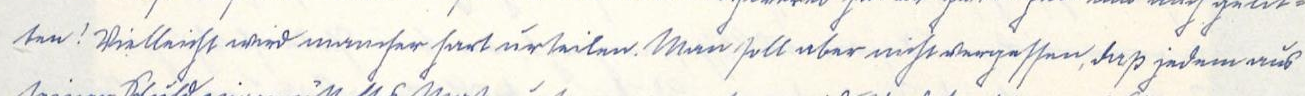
ten! Vielleicht wird mancher hart urteilen. Man soll aber nicht vergessen, dass jedem aus
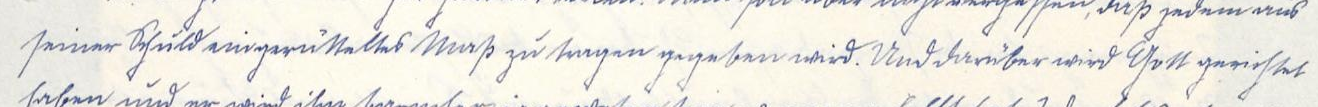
seiner Schuld eingerütteltes Maß zu tragen gegeben wird. Und .darüber wird Gott gerichtet
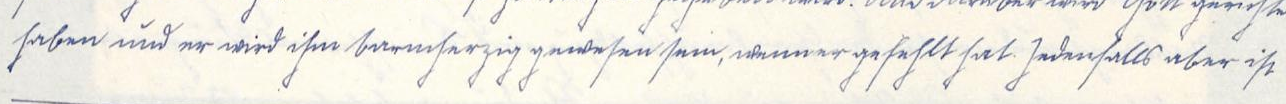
haben und der wird ihm barmherzig gewesen sein, wenn er gefehlt hat. Jedenfalls aber ist.
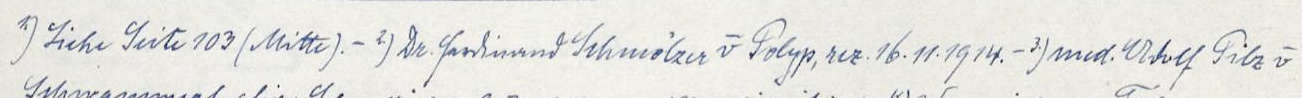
1.) Siehe Seite 103 (Mitte).– 2) Dr. Ferdinand Schmölzer v/o Polyp rez. 16.11.1914.- 3) med. Adolf Pilz v/o
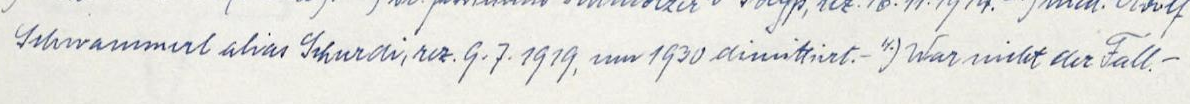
Schwammerl alias Schurdi, rez. 9. 7. 1919, um 1930 dimittiert. 4) War nicht der Fall.
